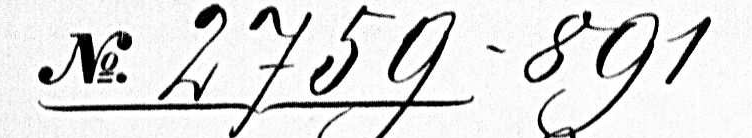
No. 2759 - 1891
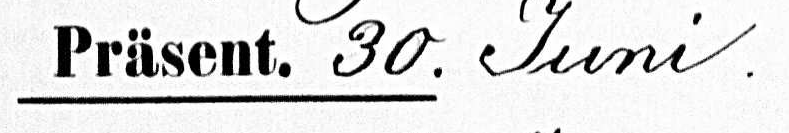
Präsent. 30 Juni
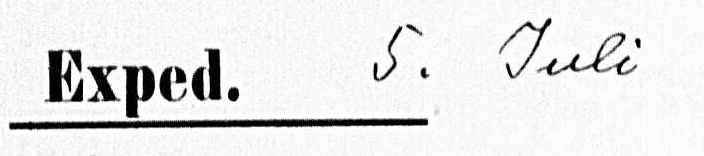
Exped. 5. Juli
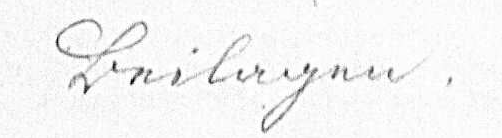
Beilagen
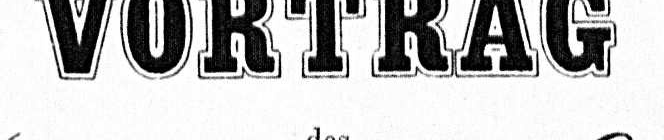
VORTRAG
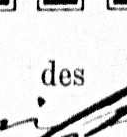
des
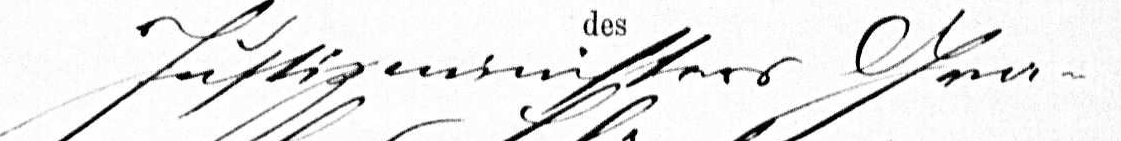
Justizministers Gra¬
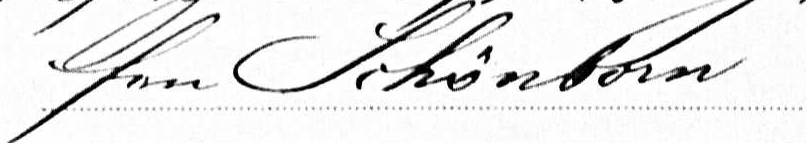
fen Schönborn
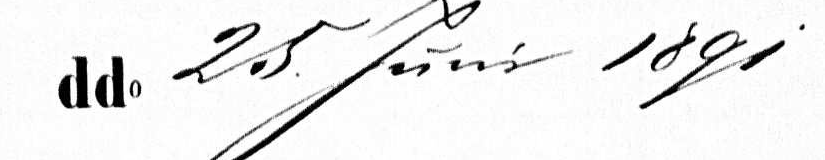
ddo 25. Juni 1891
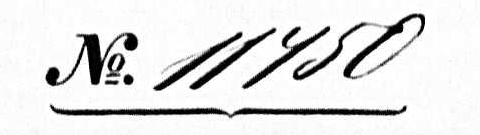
No. 11450
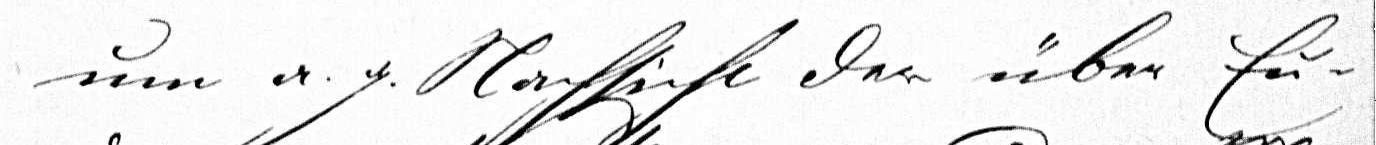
um a.g. Nachsicht der über Eu¬
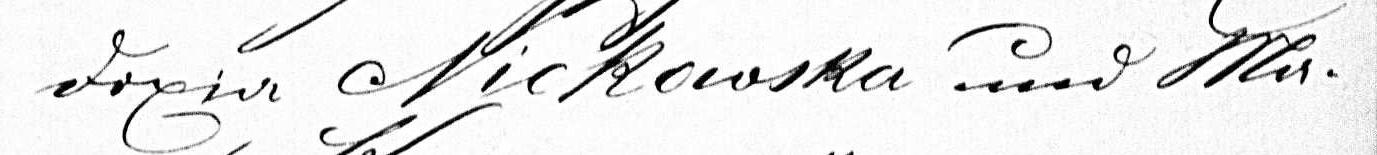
dixia Nickowska und Ma¬
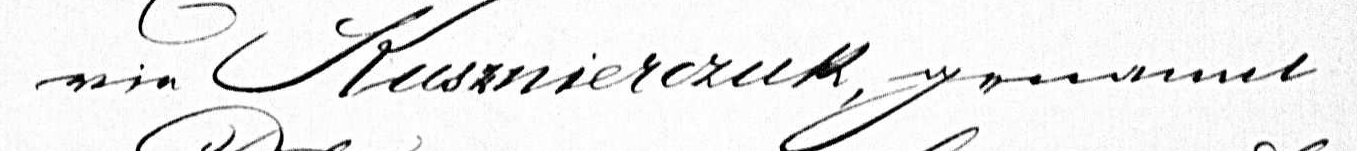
rie Kusznierczuk, genannt
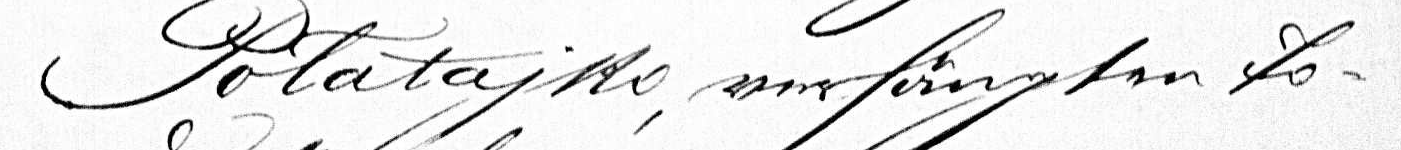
Połatajko, verhängten To¬
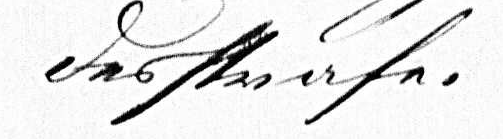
desstrafe.
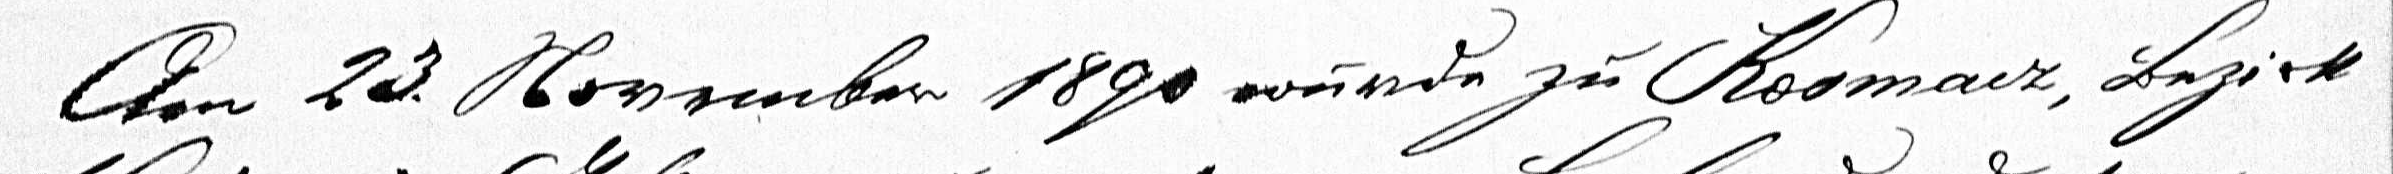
Am 23. November 1890 wurde zu Kosmacz, Bezirk
